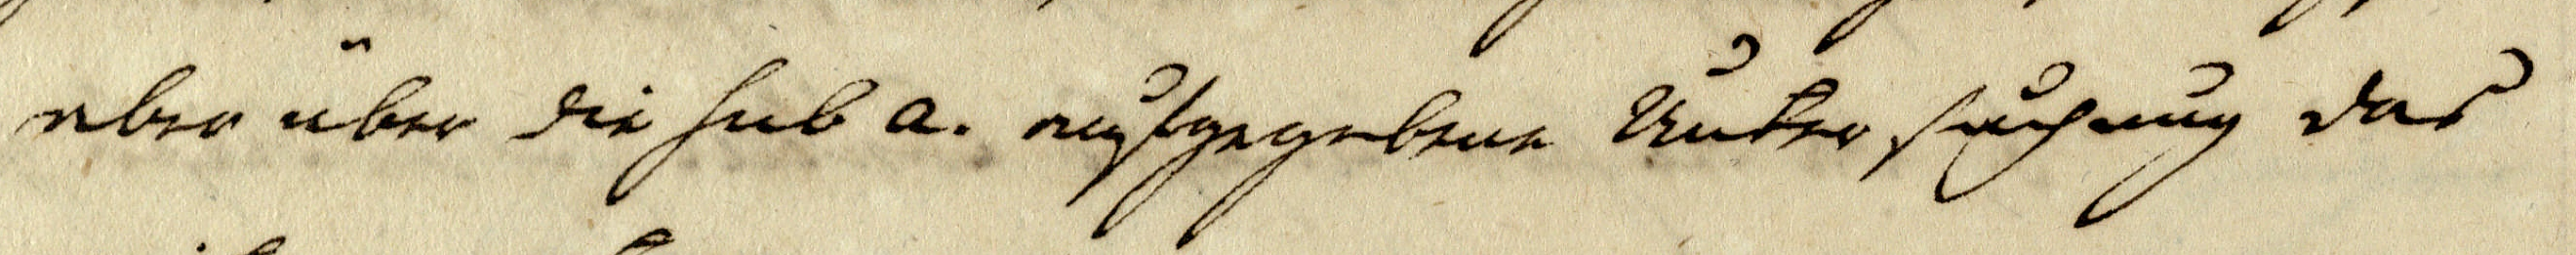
aber über die sub a. aufgegebene Untersuchung das
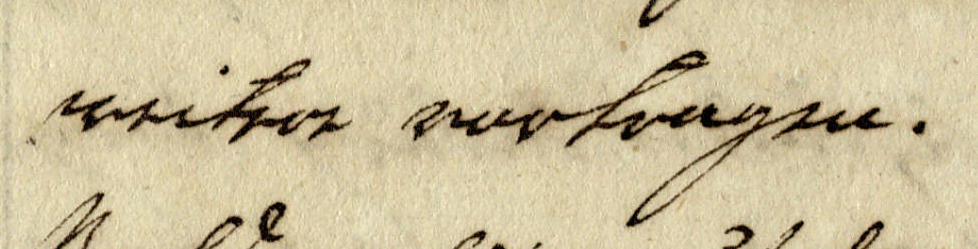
weitere vortragen.
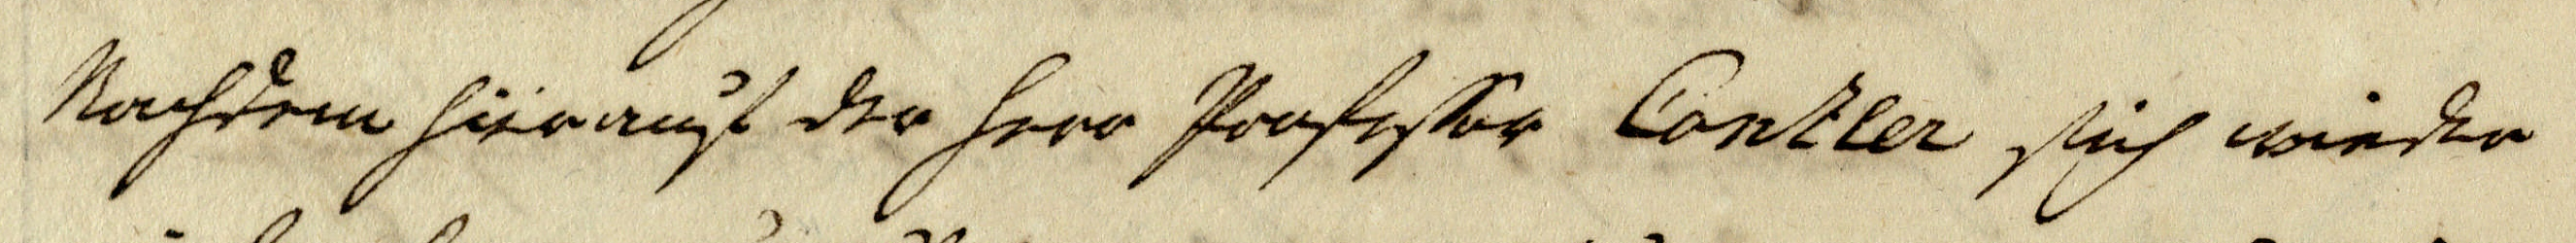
Nachdem hierauf der Herr Professor Canzler sich wieder
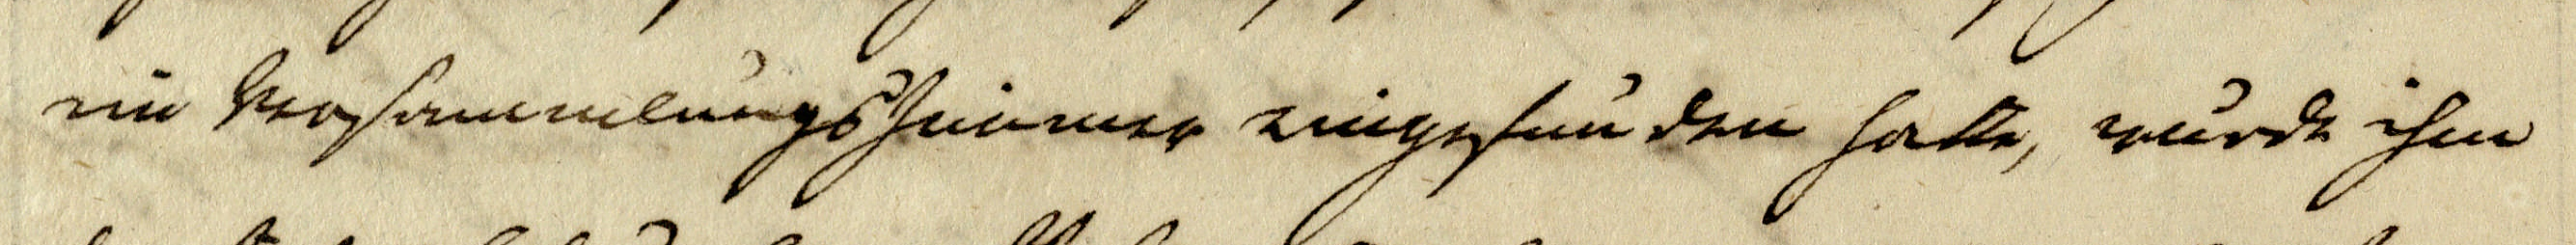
im Versammlungszimmer eingefunden hatte, wurde ihm
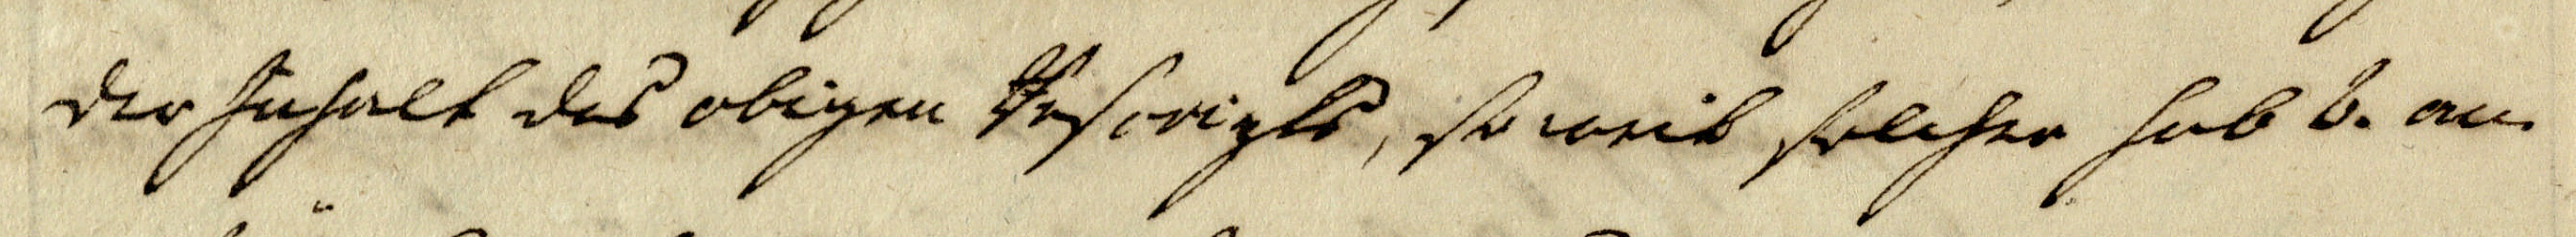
der Inhalt des obigen Rescripts, so weit solcher sub b. an¬
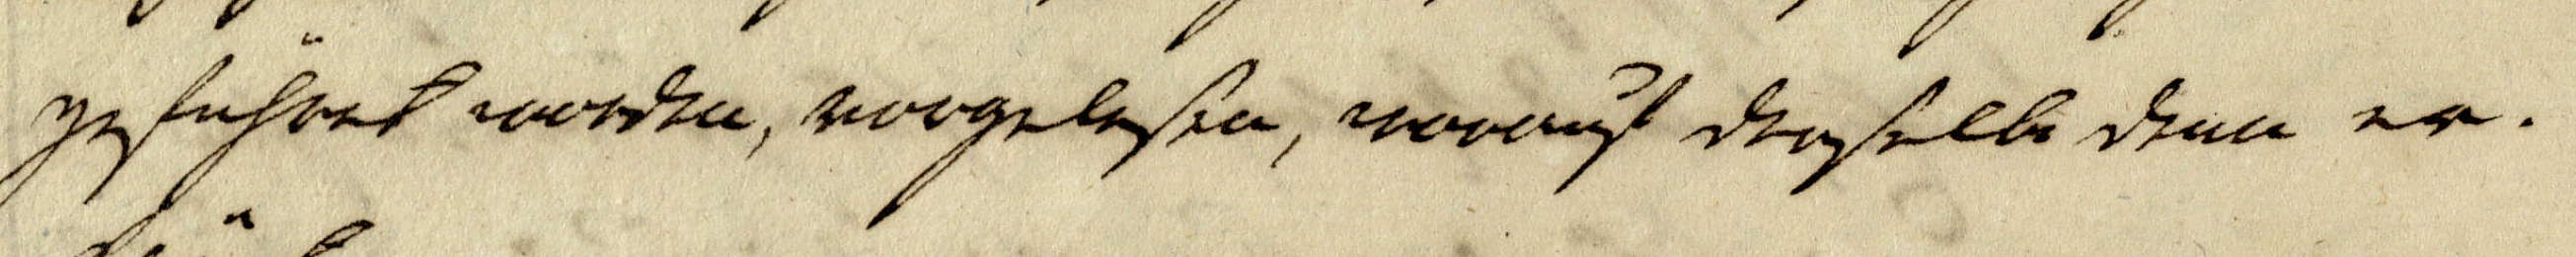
geführet worden, vorgelesen, worauf derselbe denn er¬
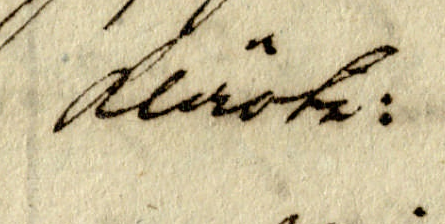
klärte:
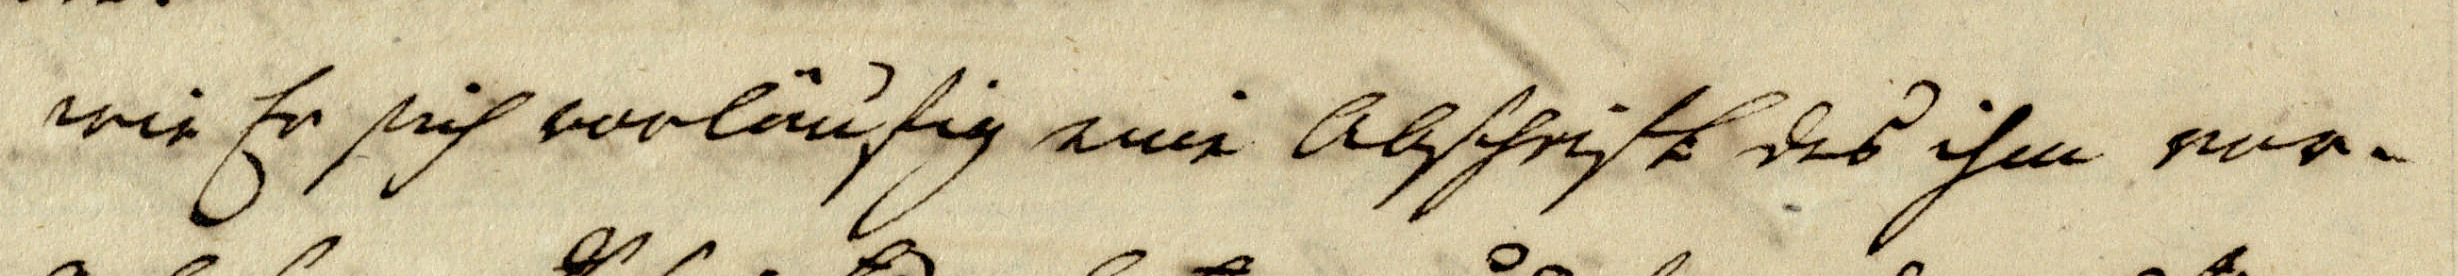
wie Er sich vorläufig eine Abschrift des ihm vor¬
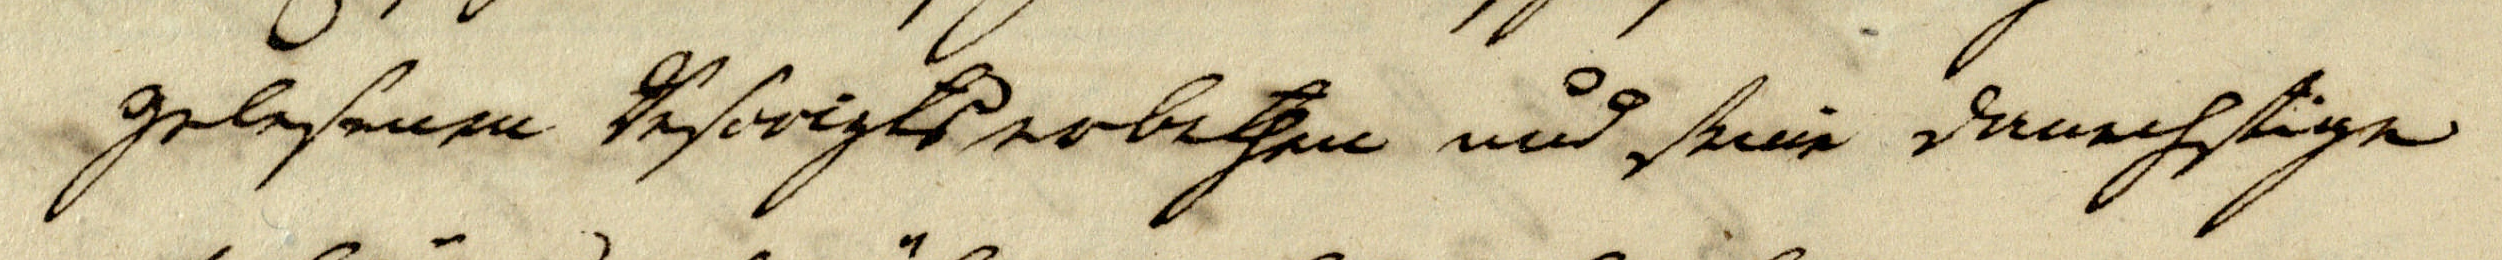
gelesenen Rescripts erbethen und seine danechstige
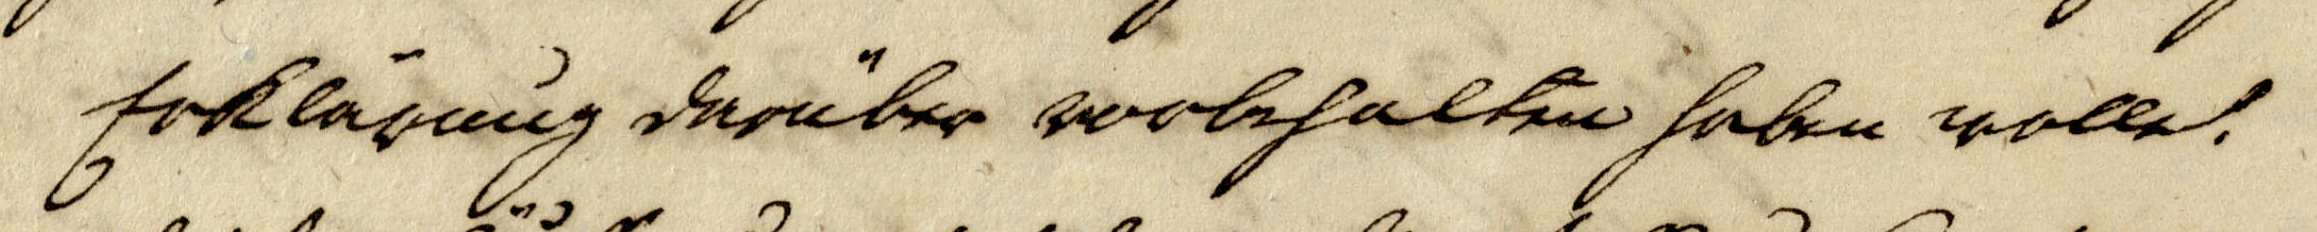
Erklärung darüber vorbehalten haben wolle.
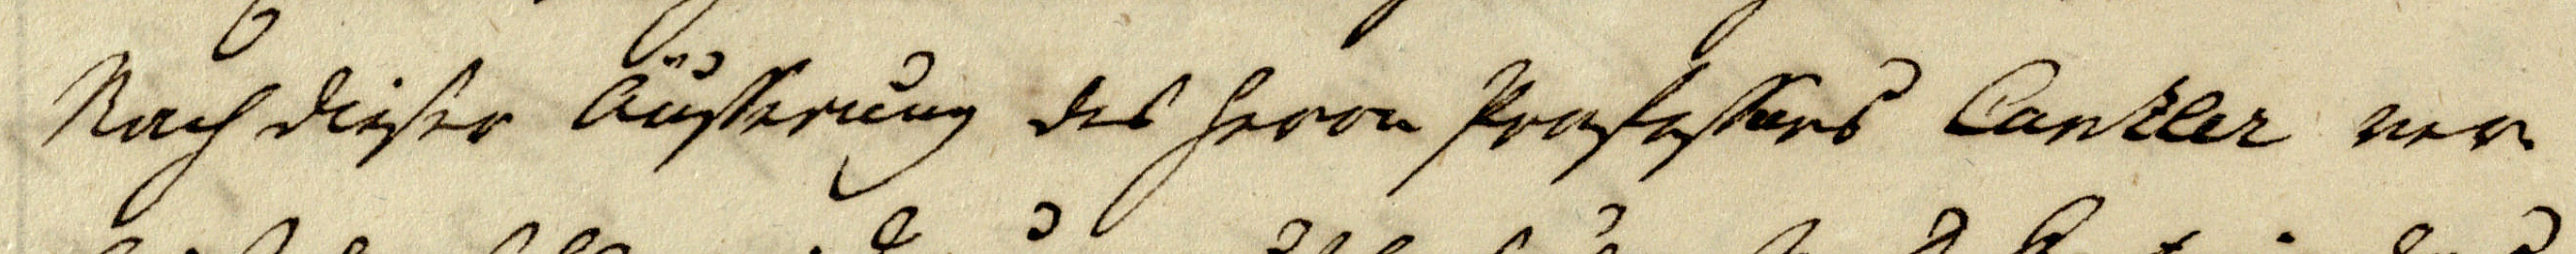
Nach dieser Äusserung des Herrn Professors Canzler ver¬
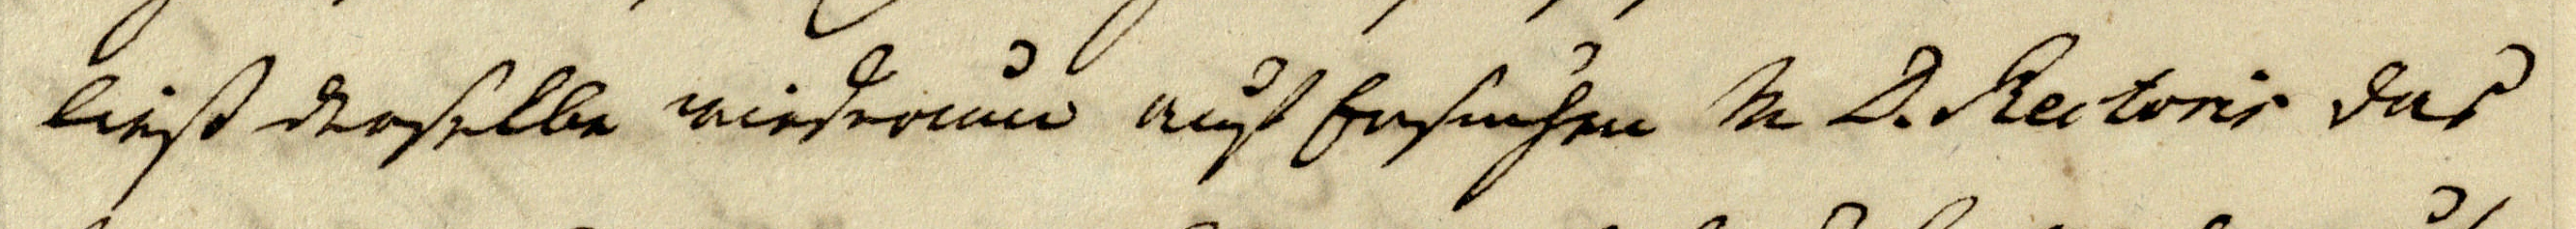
ließ derselbe wiederum auf Ersuchen M. D. Rectoris das
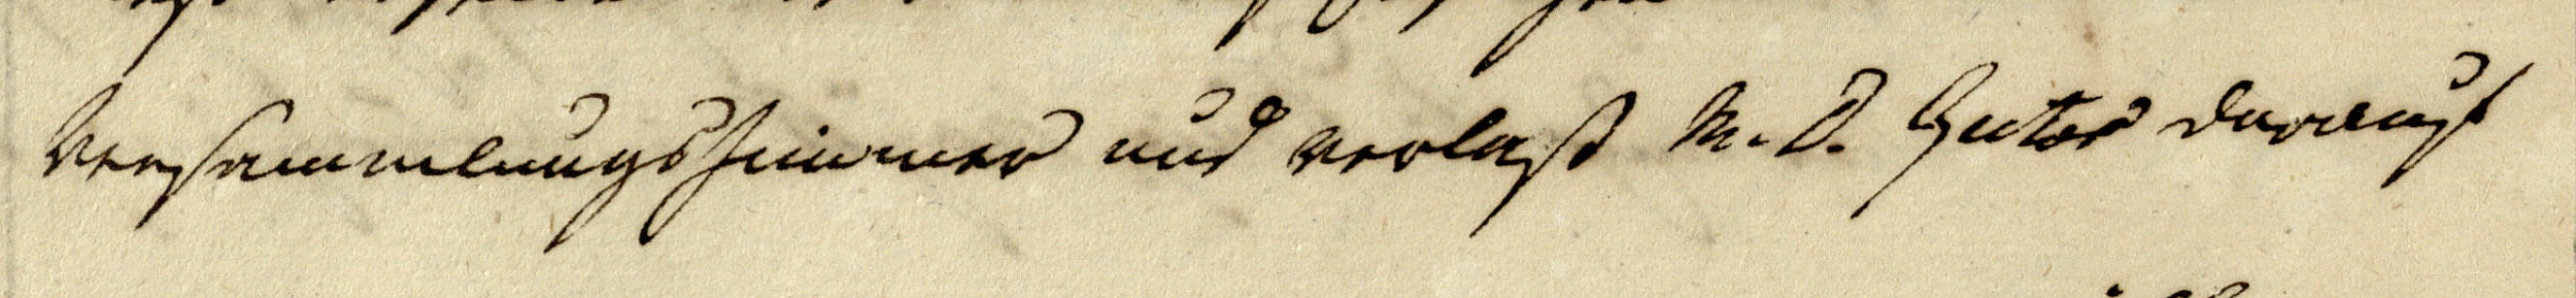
Versammlungszimmer und verlaß M. D. Rector darauf
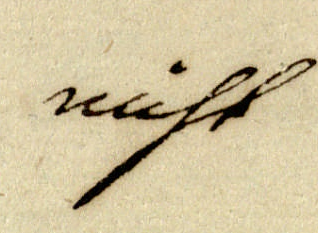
nicht
